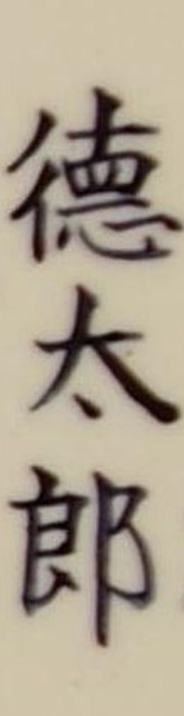徳太郎
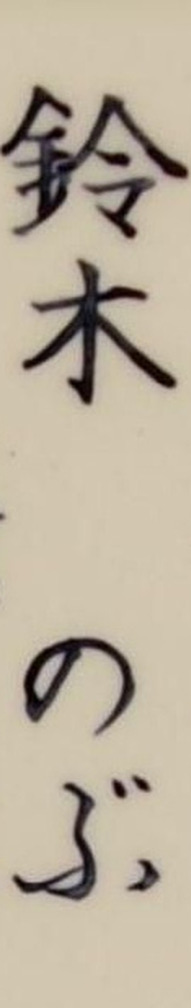鈴木のぶ
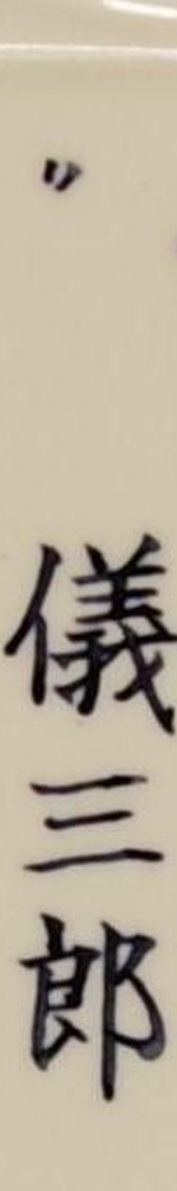儀三郎
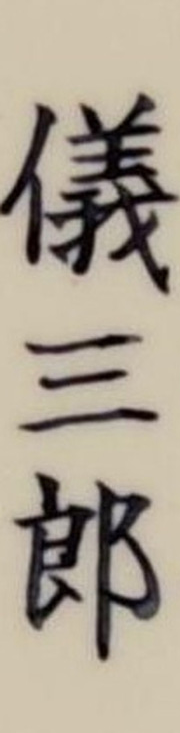儀三郎
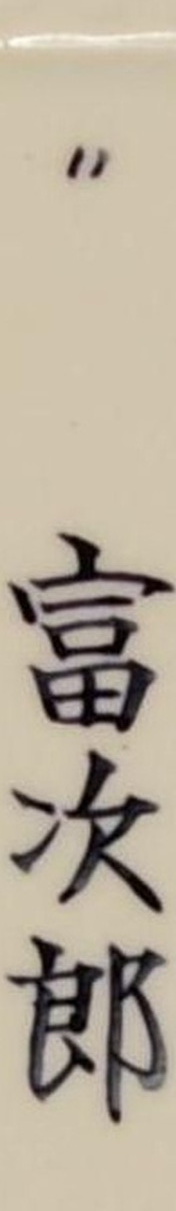富次郎
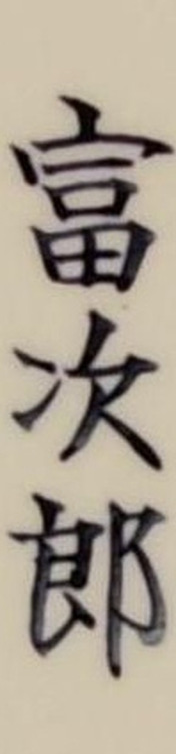富次郎
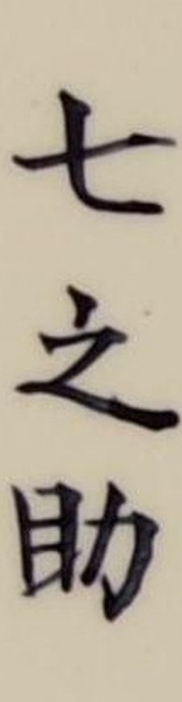七之助
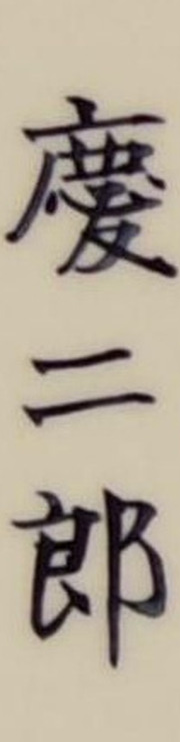慶二郎
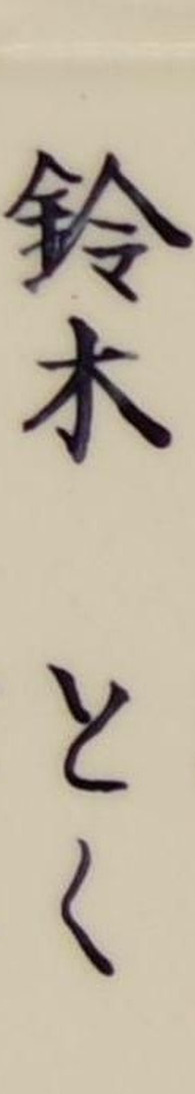鈴木とく
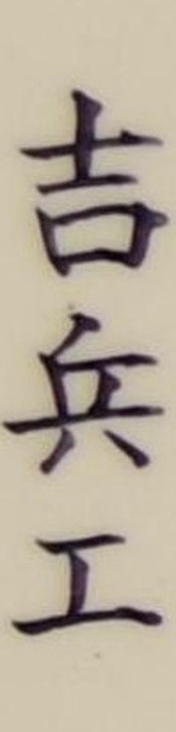吉兵エ
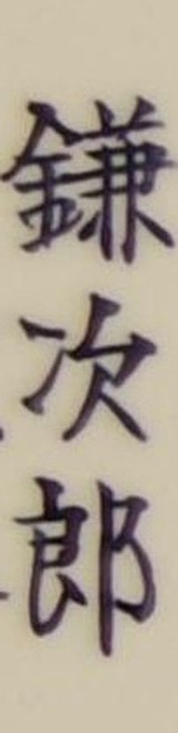鎌次郎

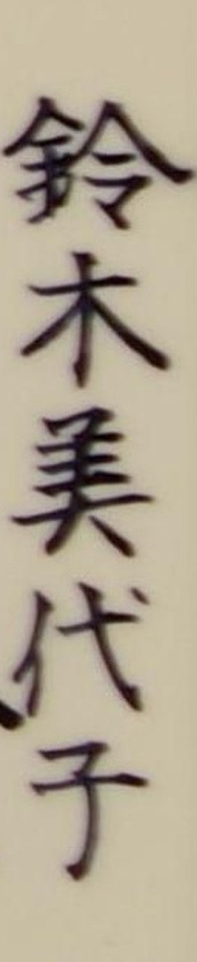鈴木美代子
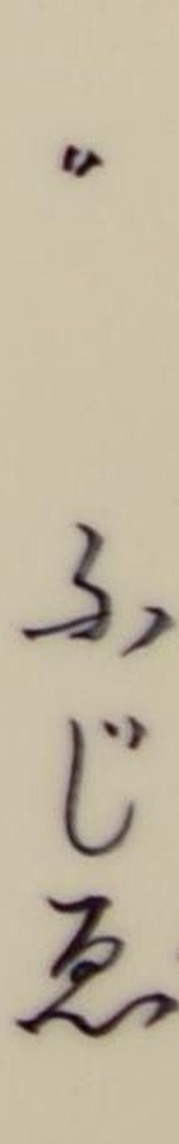ふじゑ
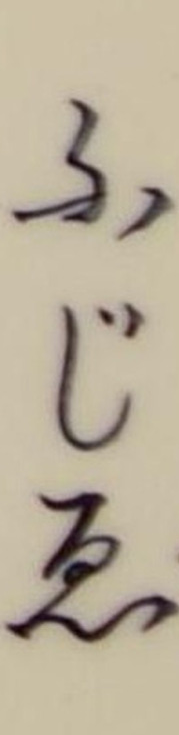ふじゑ
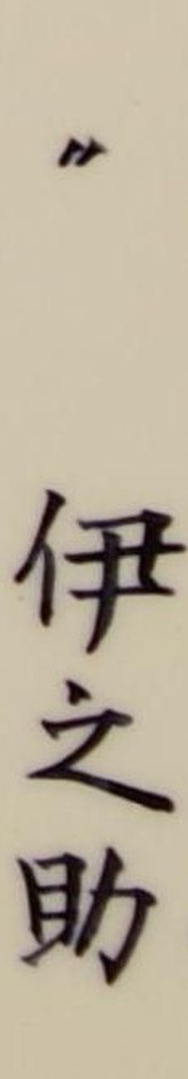伊之助
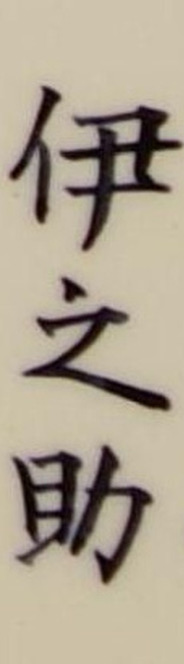伊之助
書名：A~D
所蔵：koyasan kongobuji
